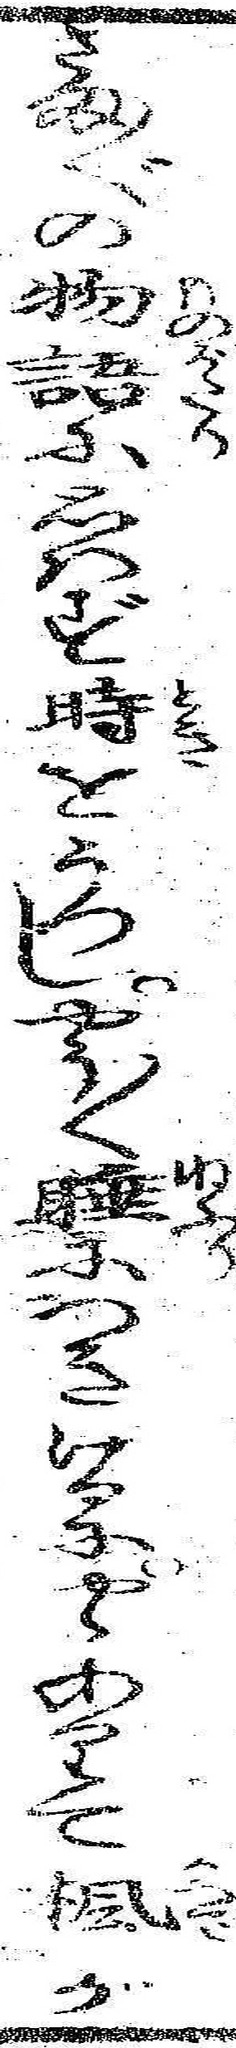さま〴〵の物語に思はず時をうつし。やう〳〵睡につきけるに。やゝありて楓が
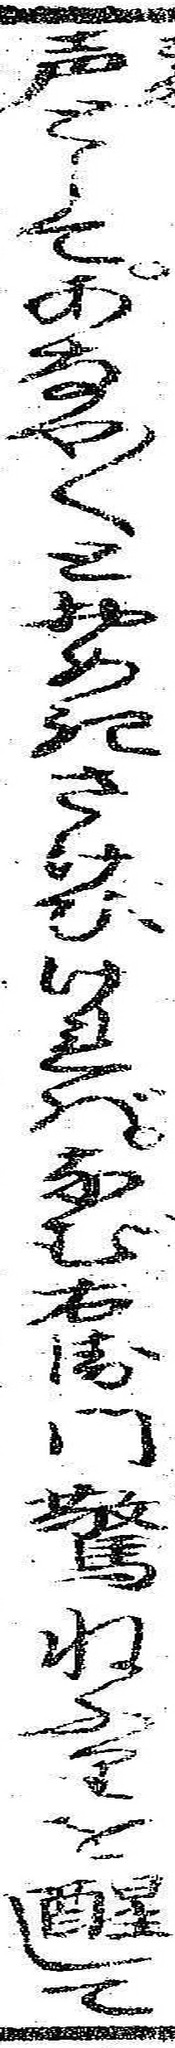声として。あなや〳〵とおめきさけひければ。なむ右衛門驚ねふりを醒して
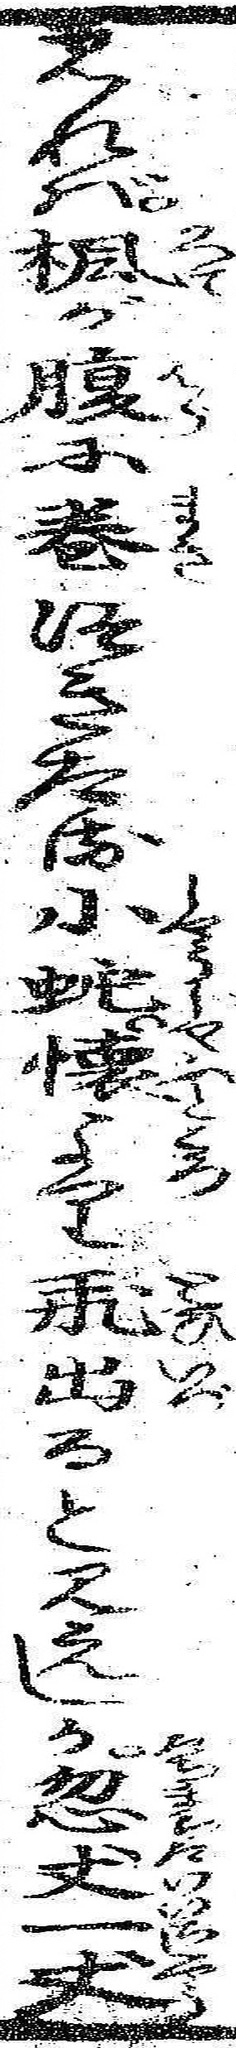見れば。楓が腹に巻つきたる小蛇。懐より飛出ると見えしか。忽丈一丈
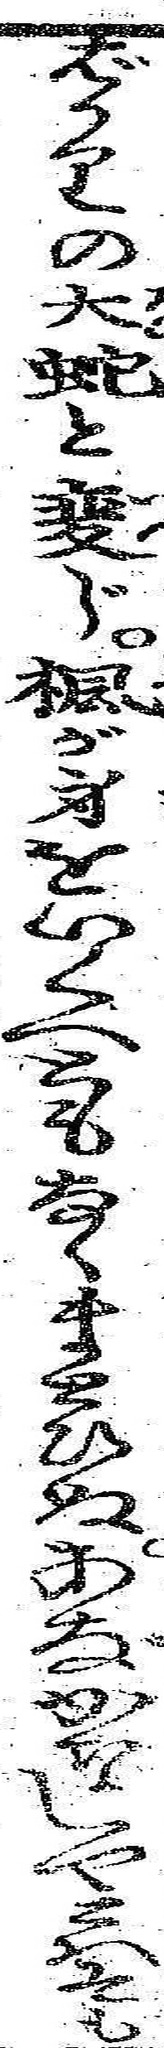ばかりの大蛇と変じ。楓が身をいくへともなくまとひぬ。あなかなしやこはそも
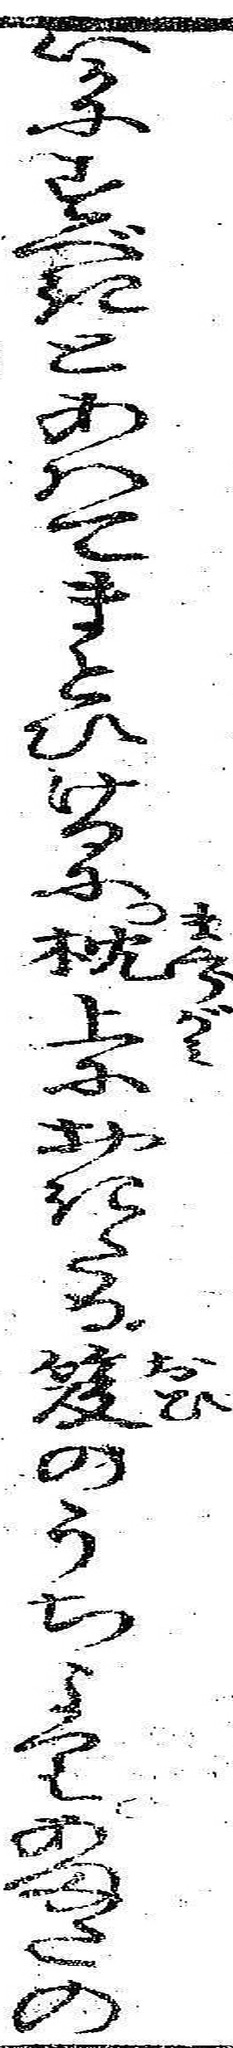いかにすべきとあはてまとひけるに。枕上におきたる笈のうちより。あまたの
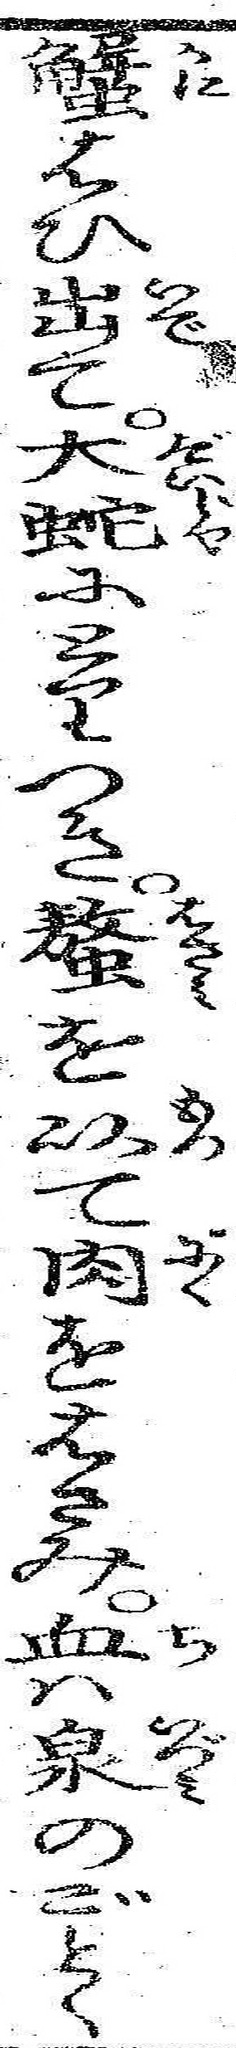蟹はひ出て。大蛇にとりつき。螯を以て肉をはさみ。血は泉のごとく
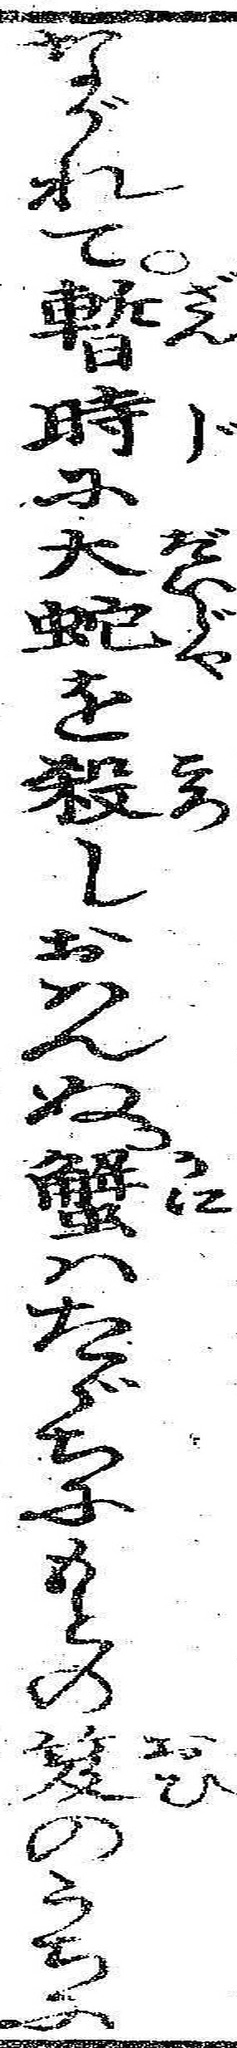ながれて。暫時に大蛇を殺しおはんぬ。蟹はたゞちにもとの笈のうちに
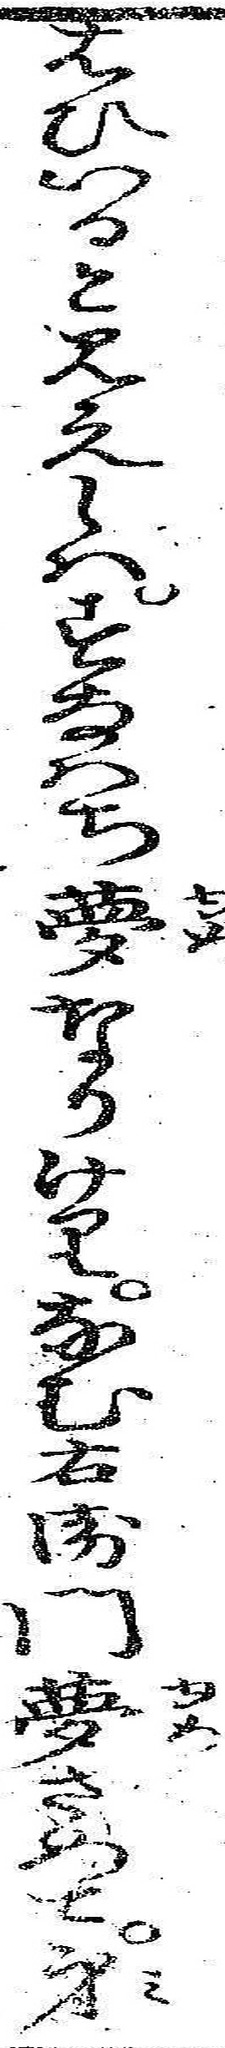はひいると見えしは。すなはち夢なりけり。なむ右衛門夢さめて。身
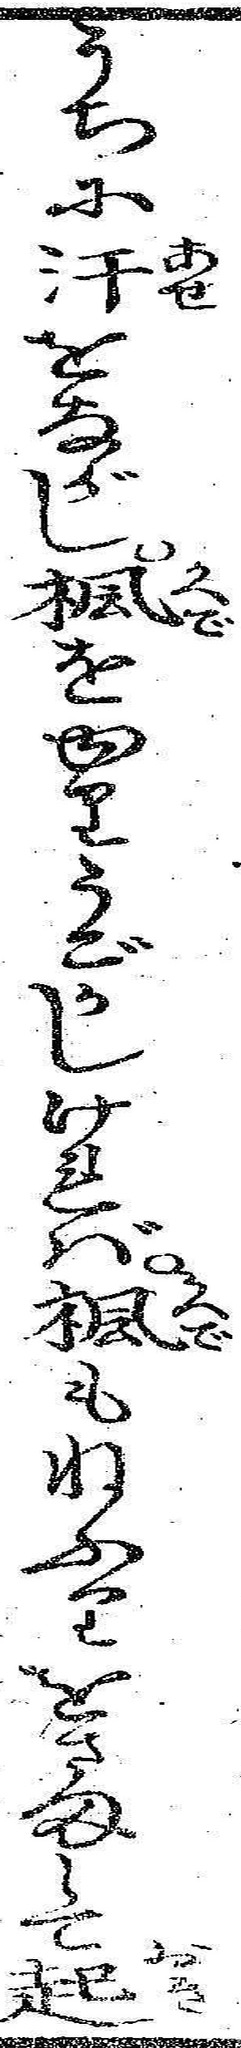うちに汗をながし。楓をゆりうごかしければ。楓もねふりをさまして起
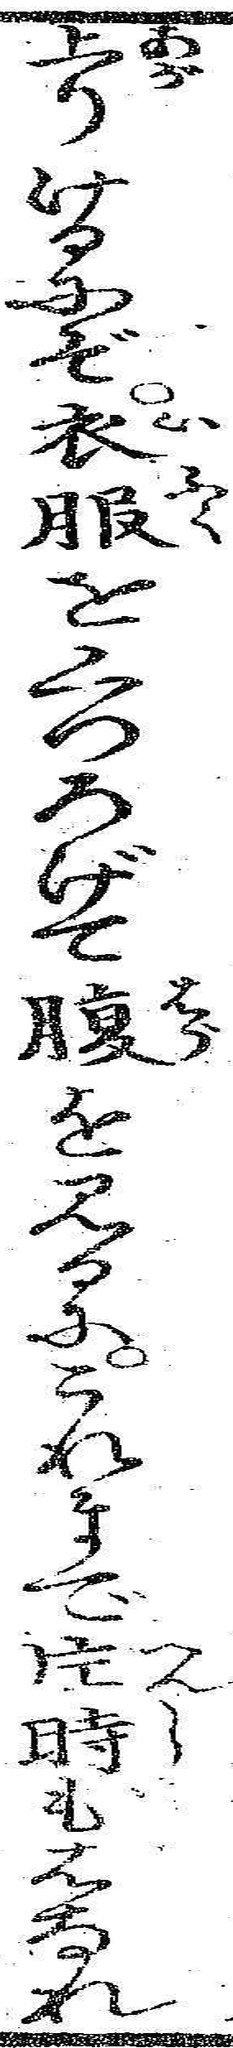上りけるにぞ。衣服をくつろげて腹を見るに。これまで片時もはなれ
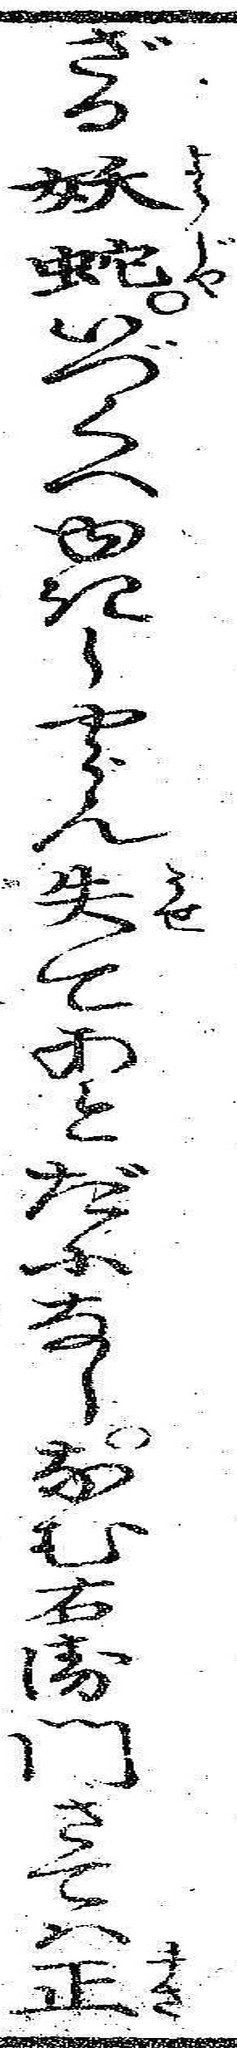ざる妖蛇。いづくへゆきしやらん失てあとだになし。なむ右衛門さては正
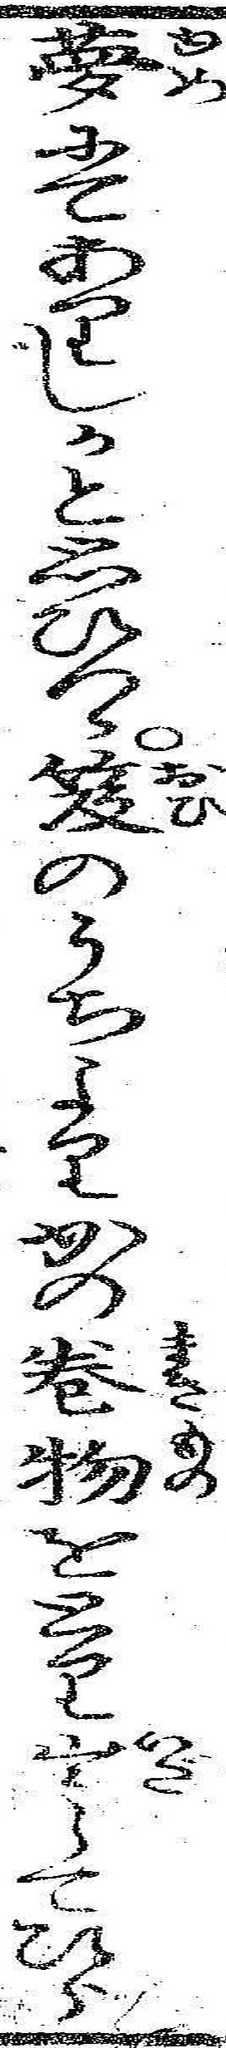夢にてありしかと思ひつゝ。笈のうちよりかの巻物をとり出してひら
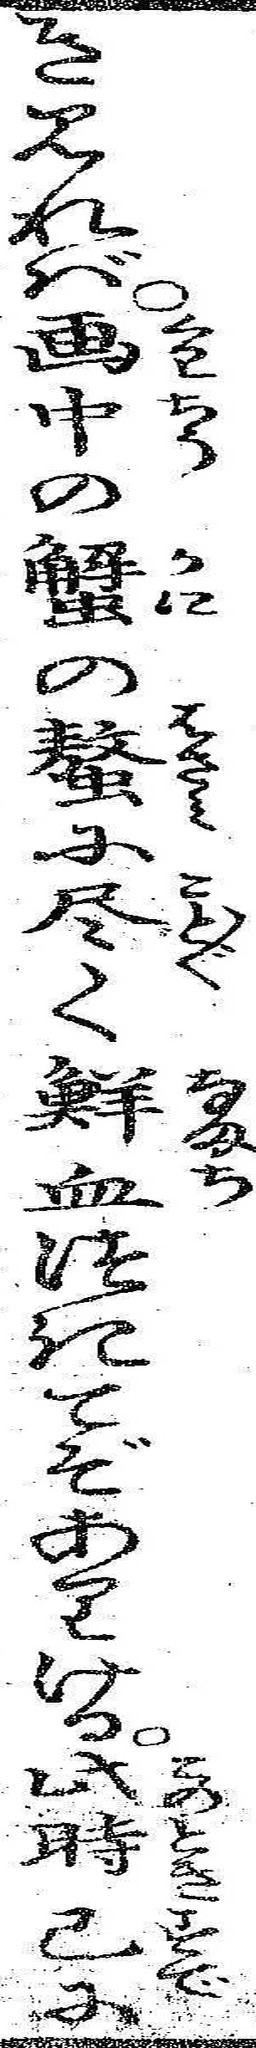き見れば。画中の蟹の螯に尽く鮮血つきてぞありける。此時已に
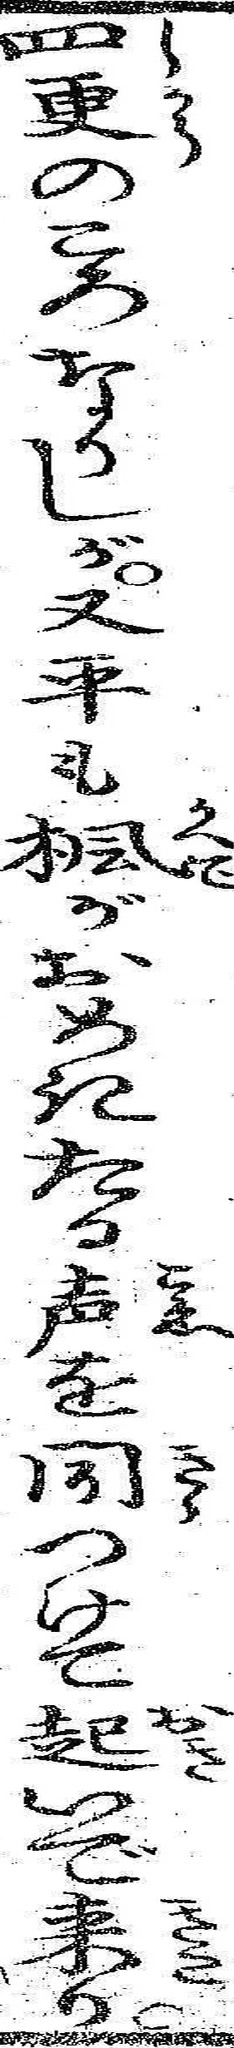四更のころなりしが。又平も楓がおめきたる声を聞つけて起いで来り。

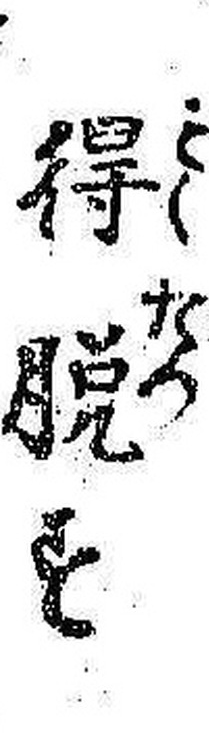得脱す
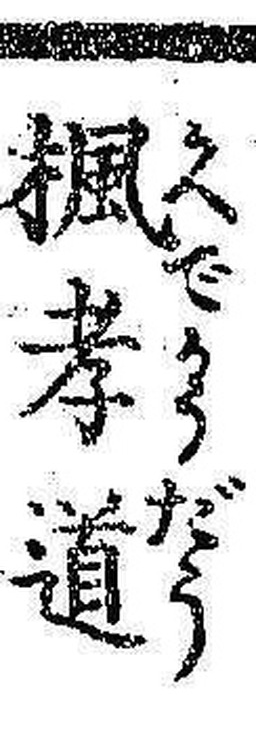楓孝道
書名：昔話稲妻表紙
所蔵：国文学研究資料館
